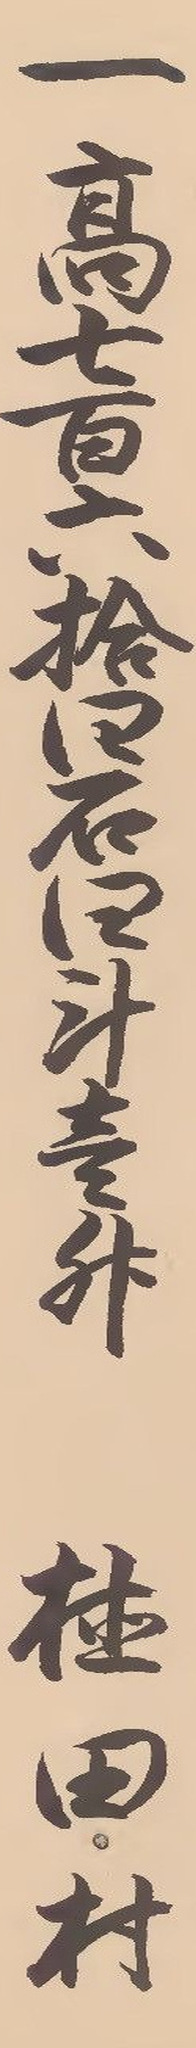一高七百六拾四石四斗壱升植田村
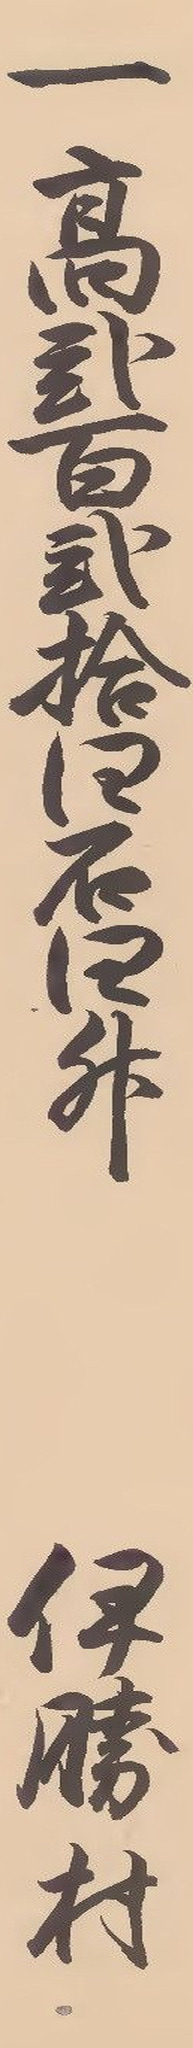一高弐百弐拾四石四升伊勝村
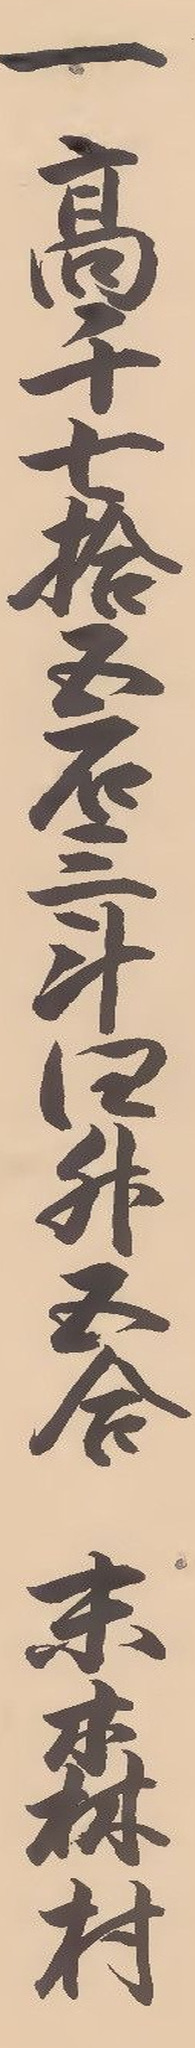一高千七拾五石三斗四升五合末森村

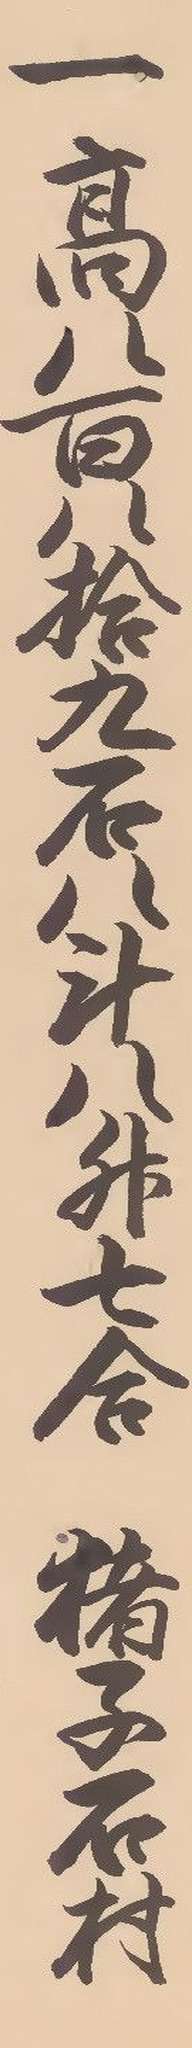一高八百八拾九石八斗八升七合猪子石村
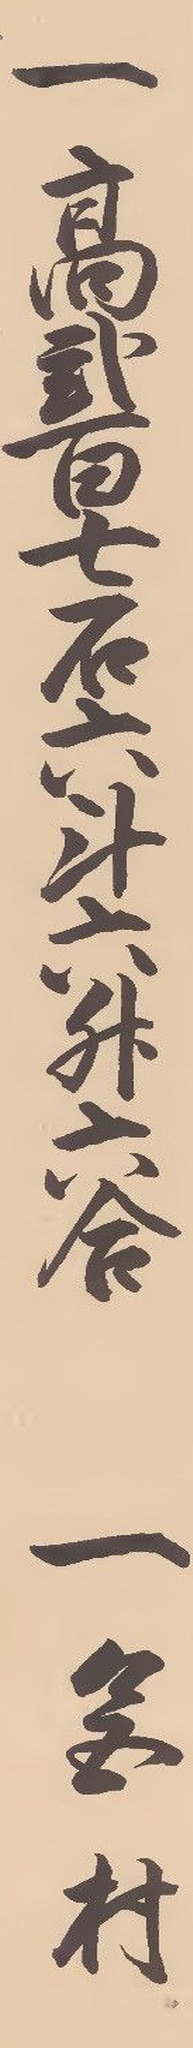一高弐百七石六斗六升六合一色村
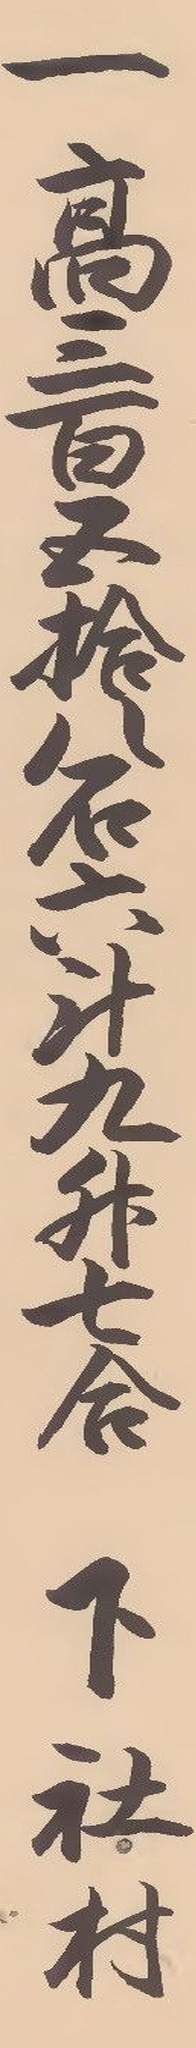一高三百五拾八石六斗九升七合下社村
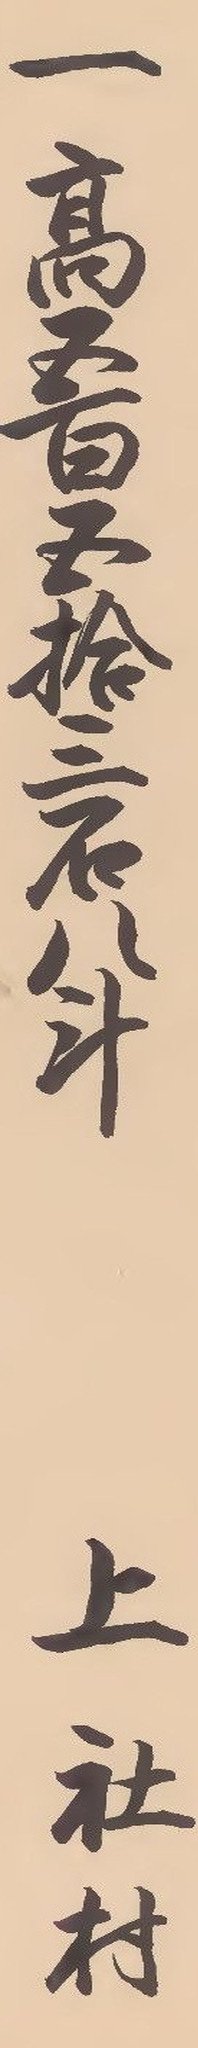一高五百五拾三石八斗上社村
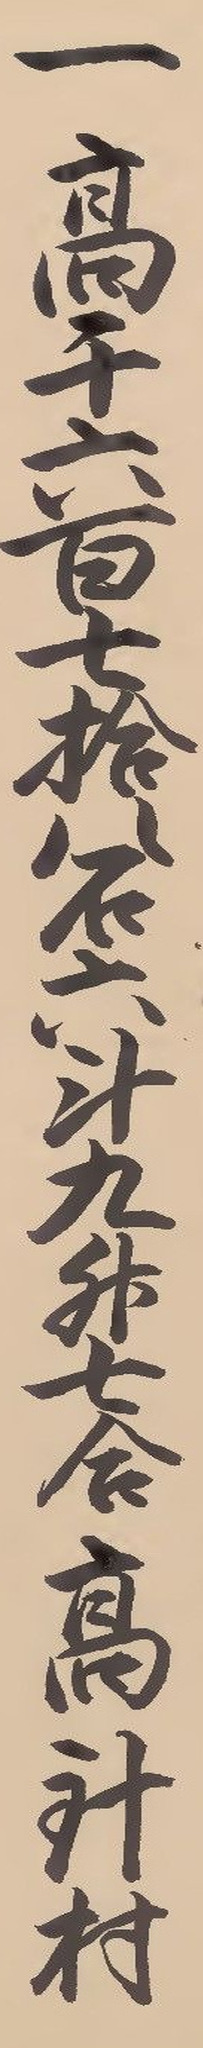一高千六百七拾八石六斗九升七合高針村
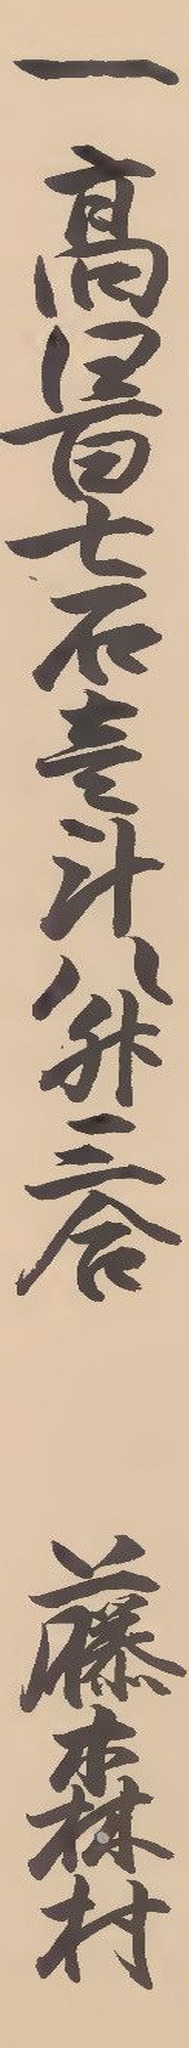一高四百七石壱斗八升三合藤森村
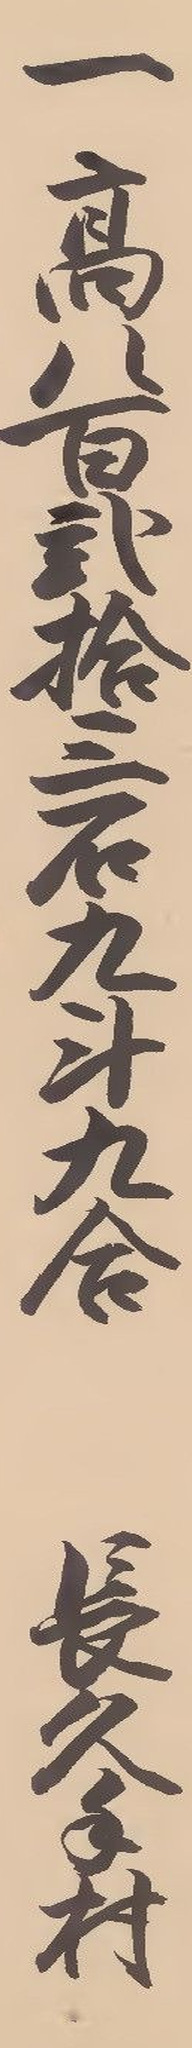一高八百弐拾三石九斗九合長久手村
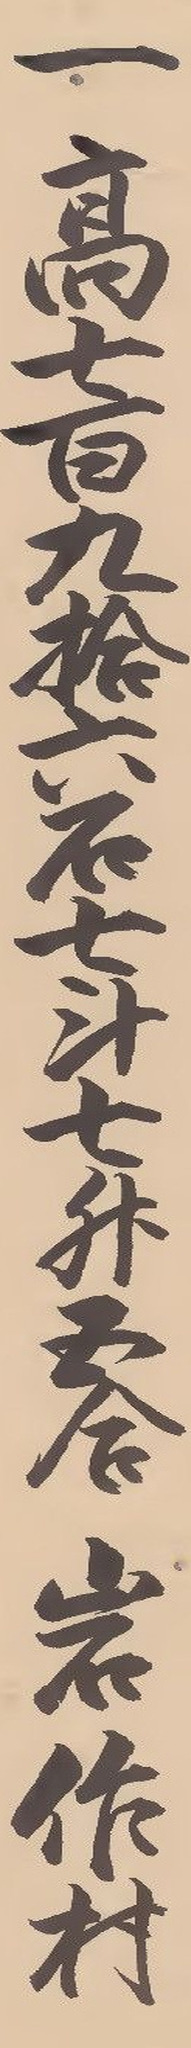一高七百九拾六石七斗七升五合岩作村

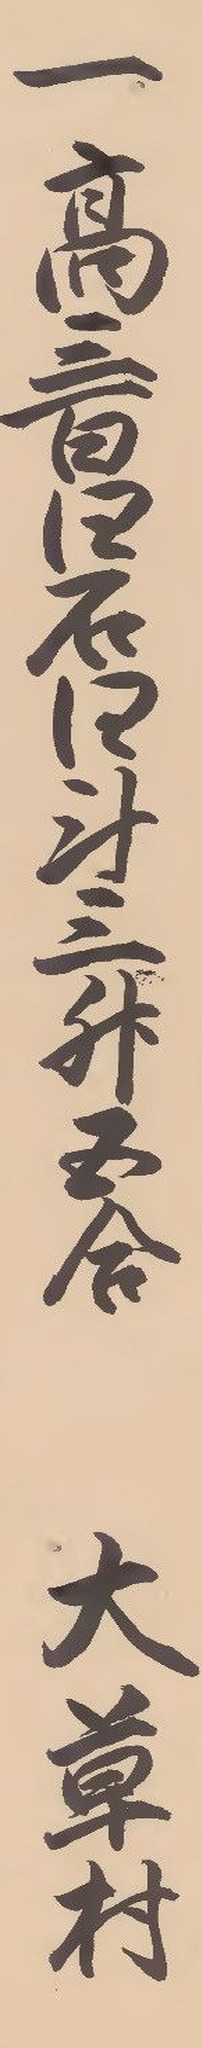一高三百四石四斗三升五合大草村
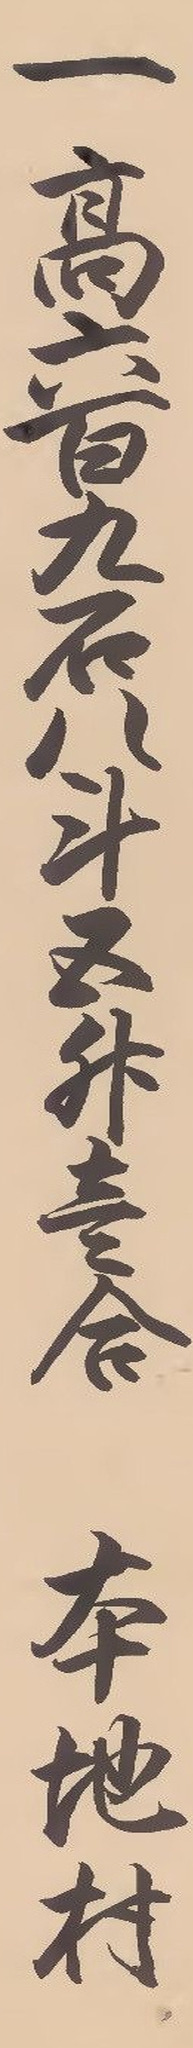一高六百九石八斗五升壱合本地村
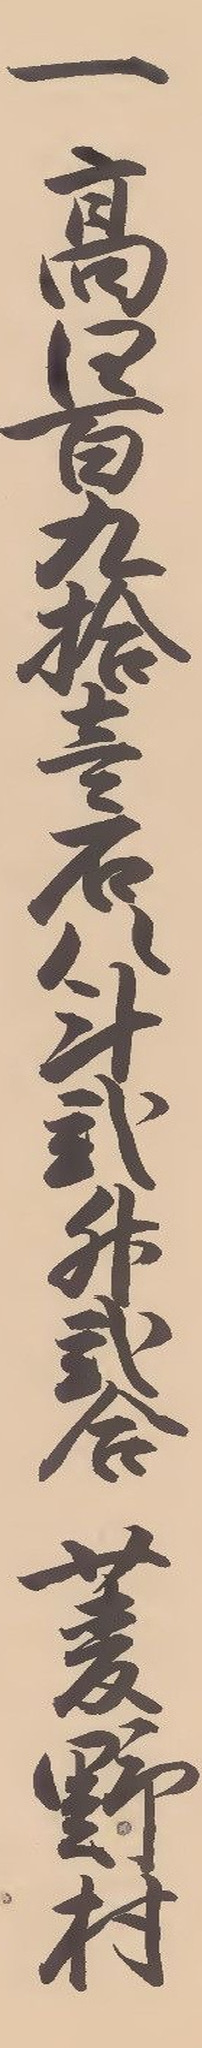一高四百九拾壱石八斗弐升弐合菱野村
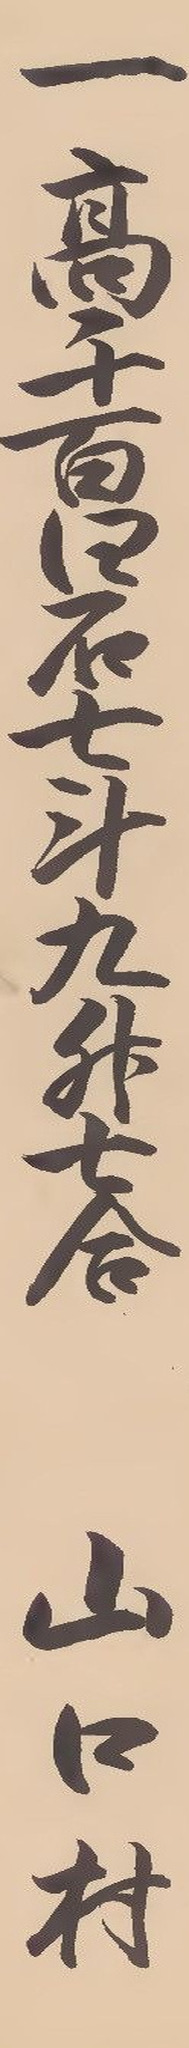一高千百四石七斗九升七合山口村
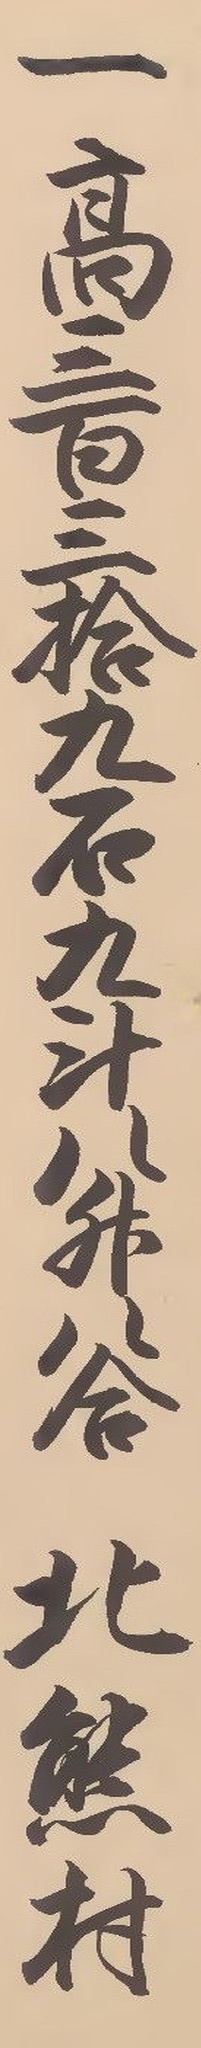一高三百三拾九石九斗八升八合北熊村
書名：尾張国郷帳
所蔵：国立公文書館 National Archives of Japan
